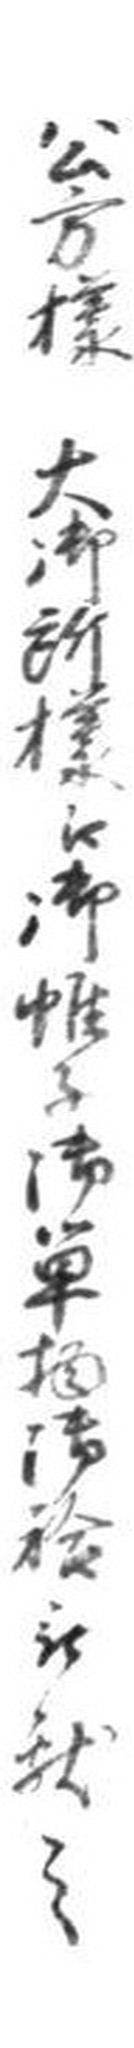公方様大御所様江御帷子御単物御袷被献之
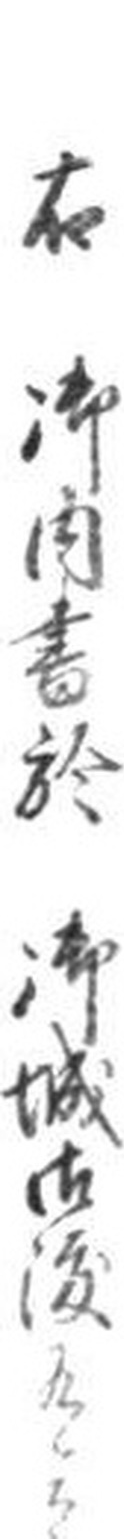右御内書於御城御渡有之
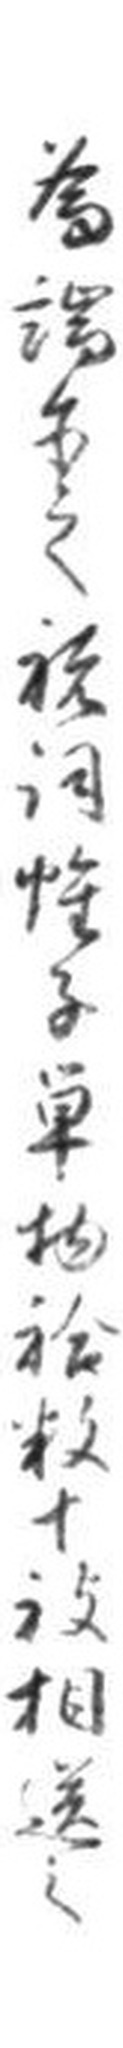為端午之祝詞帷子単物袷数十被相送之
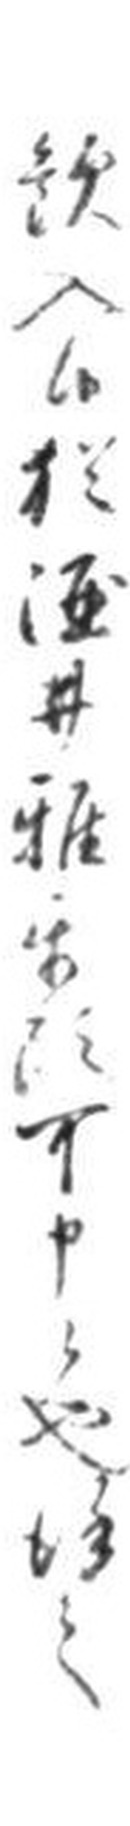歓入候猶酒井雅楽頭可申候也謹言
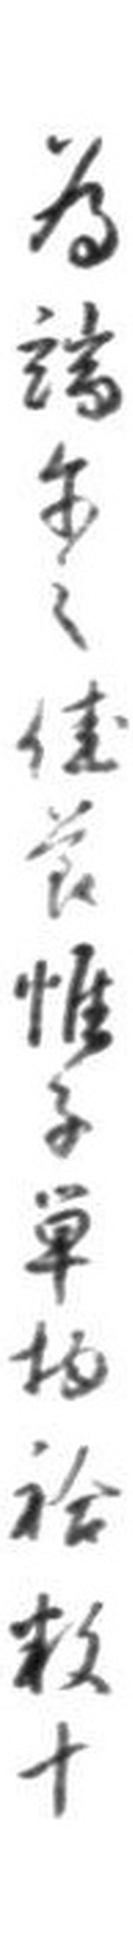為端午之佳節帷子単物袷数十
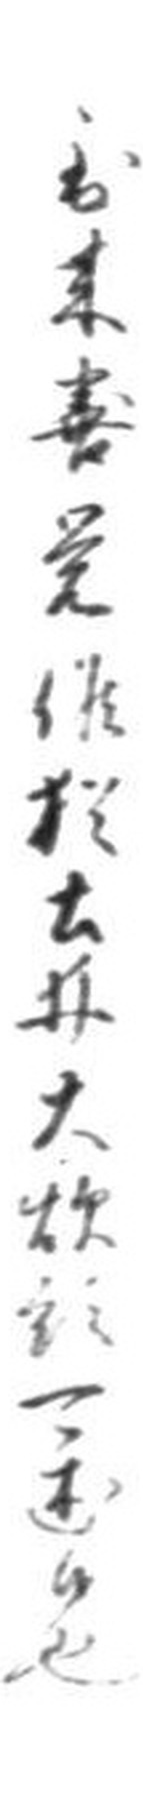到来喜覚候猶土井大炊頭可述候也
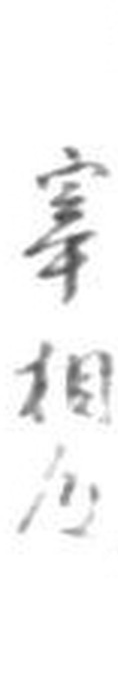宰相殿
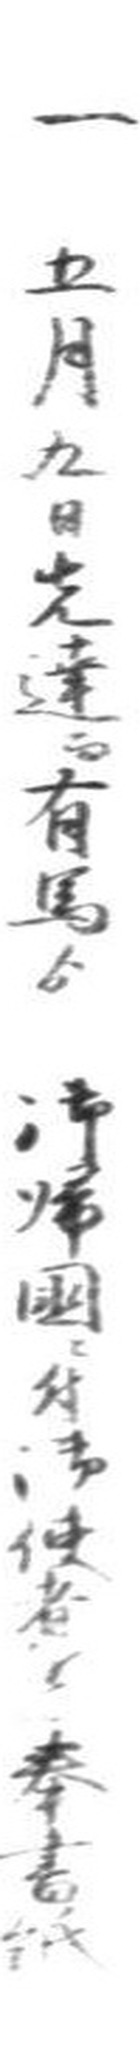一五月九日先達而有馬ゟ御帰国ニ付御使者奉書紙
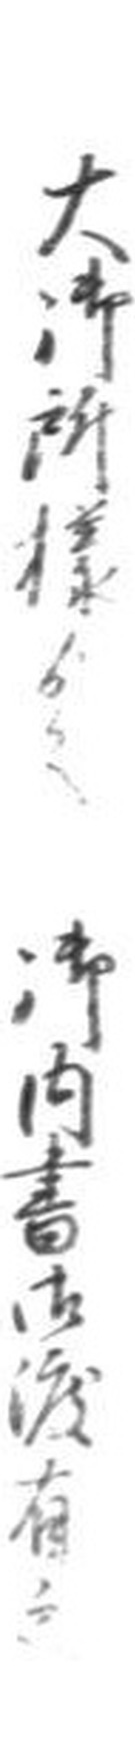大御所様ゟ之御内書御渡有之

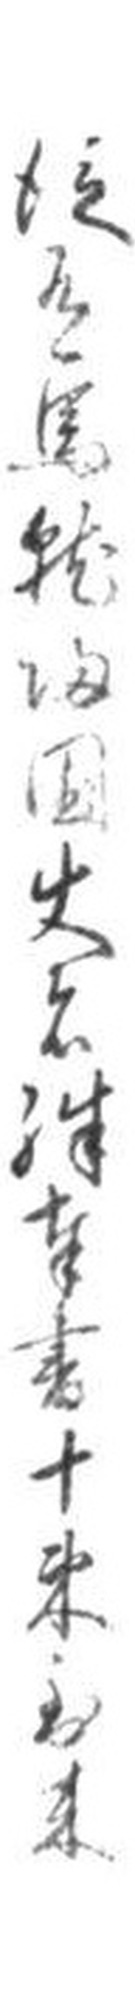従有馬就帰国使者殊奉書十束到来
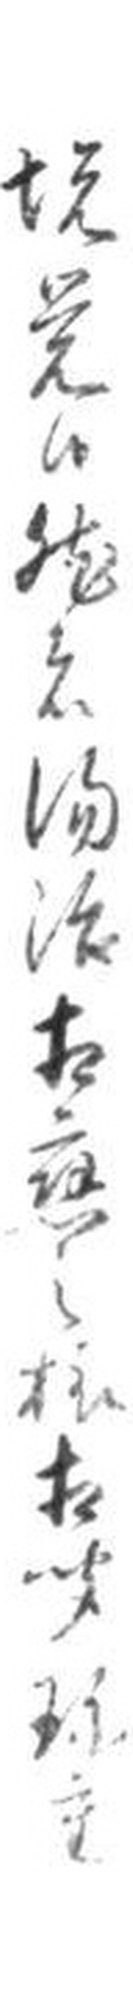悦覚候然者湯治相応之様相聞珎重
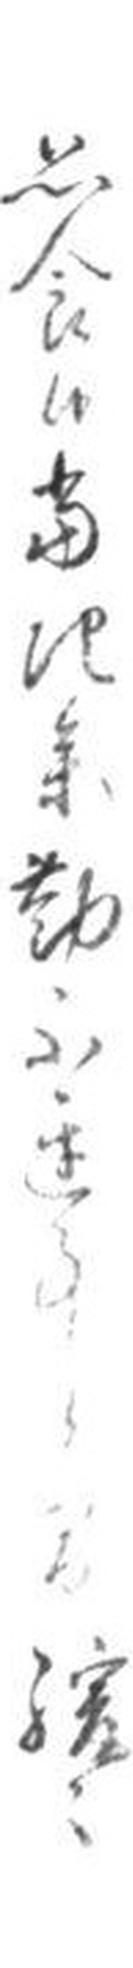思食候当地参勤不遅事候間緩々
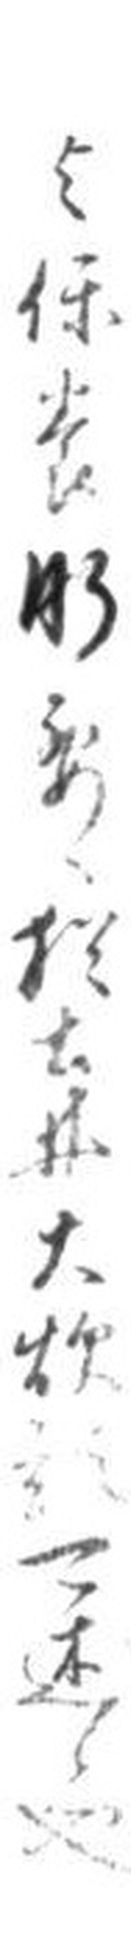と保養肝要也猶土井大炊頭可述候也
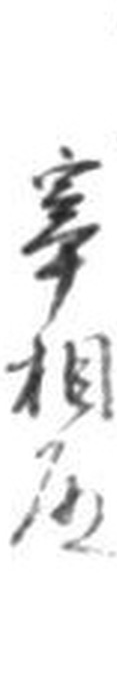宰相殿
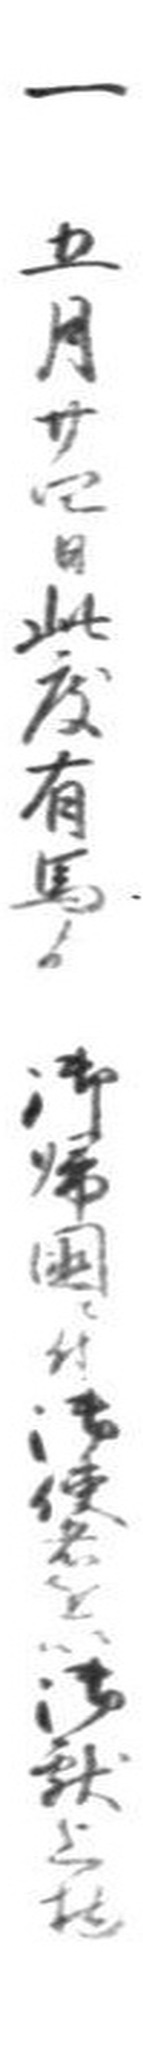一五月廿四日此度有馬ゟ御帰国ニ付御使者を以御献上物
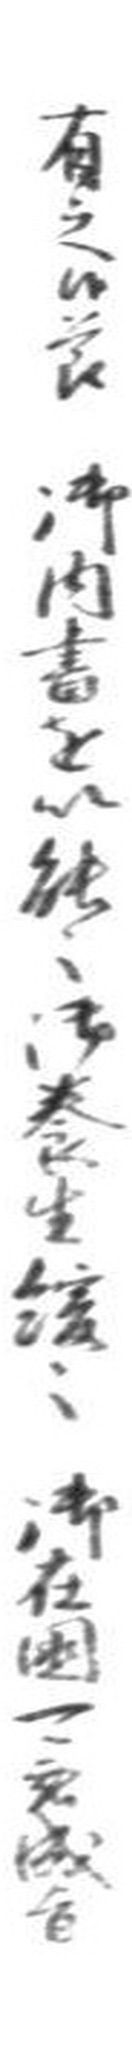有之候節御内書を以能々御養生緩々御在国可被成旨
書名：家譜 三 忠昌公 従慶長八年到寛永六年
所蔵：福井県文書館 Fukui Prefectural Archives
